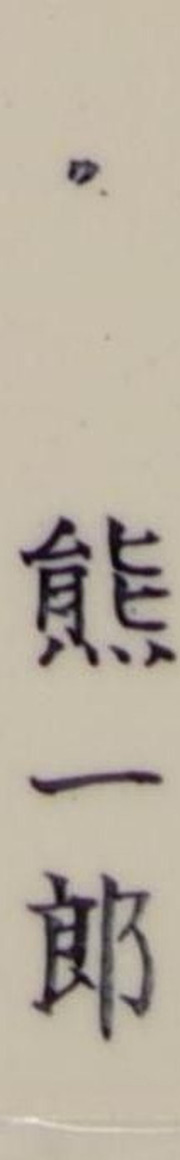熊一郎
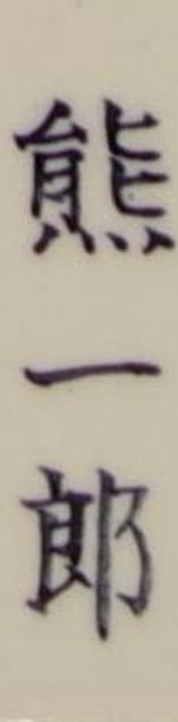熊一郎
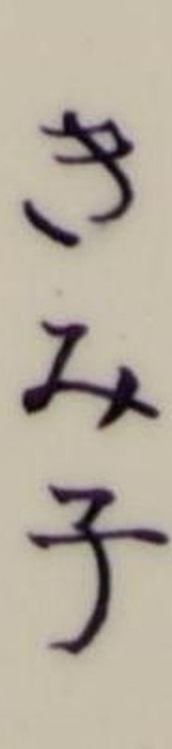きみ子
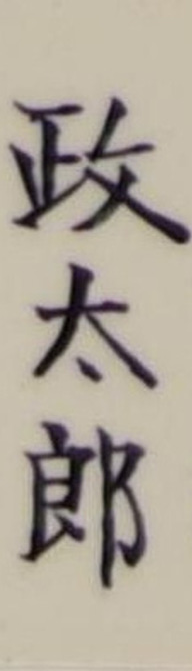政太郎
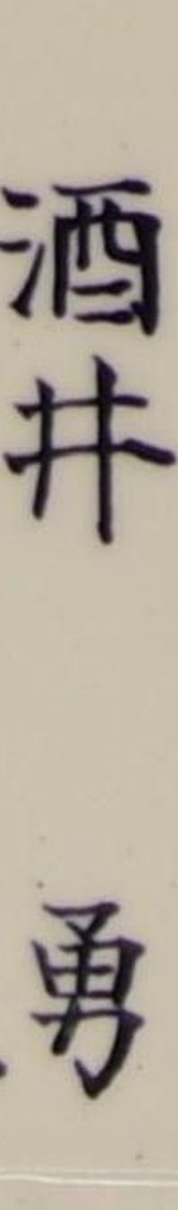酒井勇
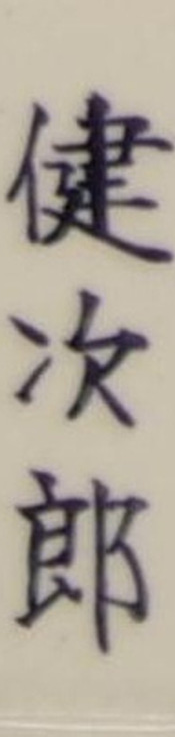健次郎

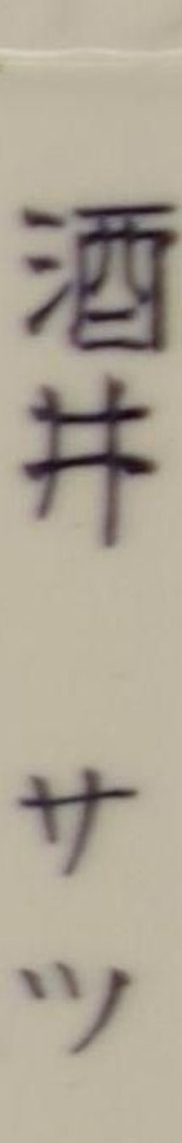酒井サツ
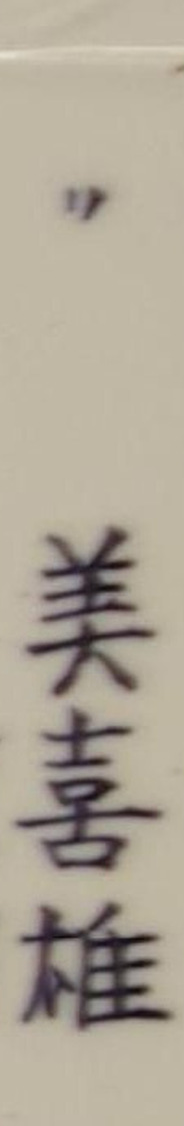美喜雄
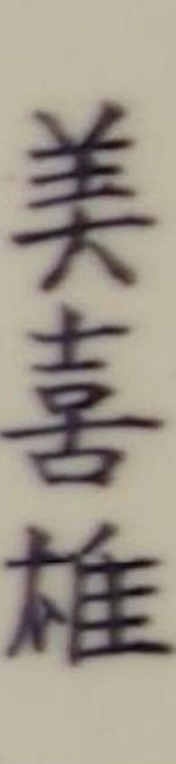美喜雄
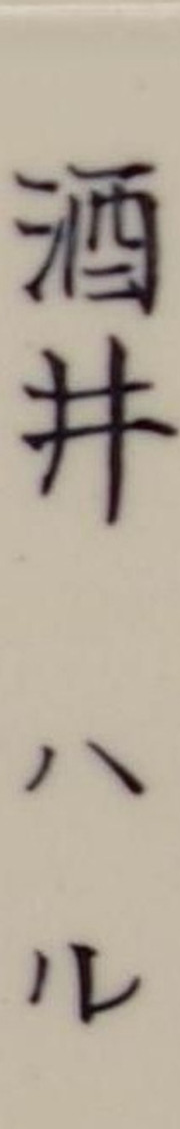酒井ハル
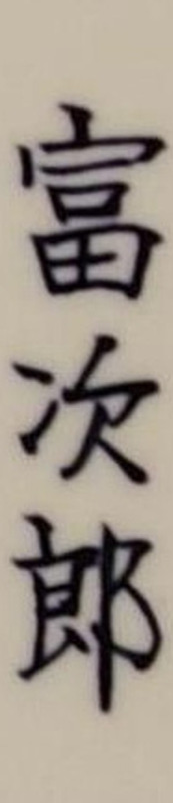富次郎
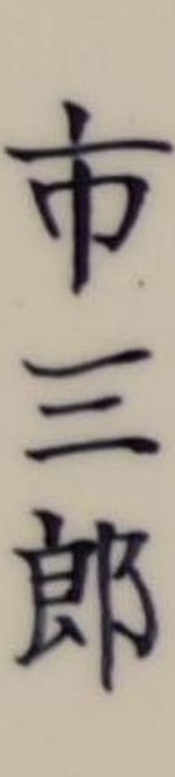市三郎

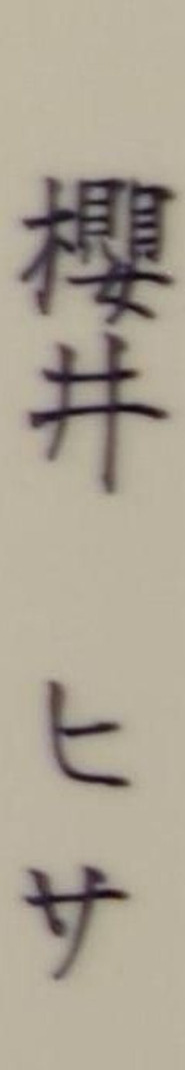桜井ヒサ
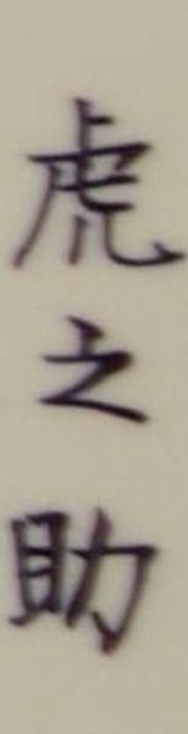虎之助
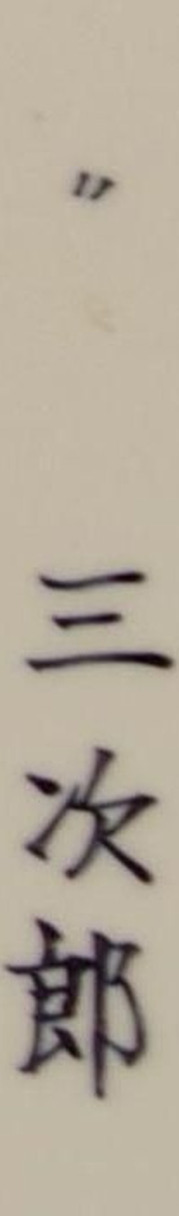三次郎
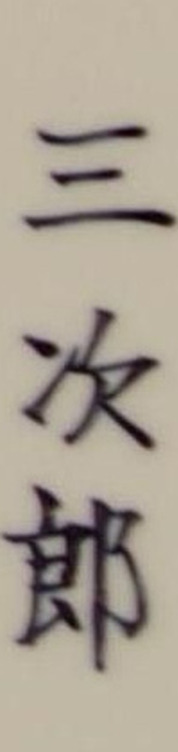三次郎
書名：E~L
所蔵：高野山金剛峯寺
